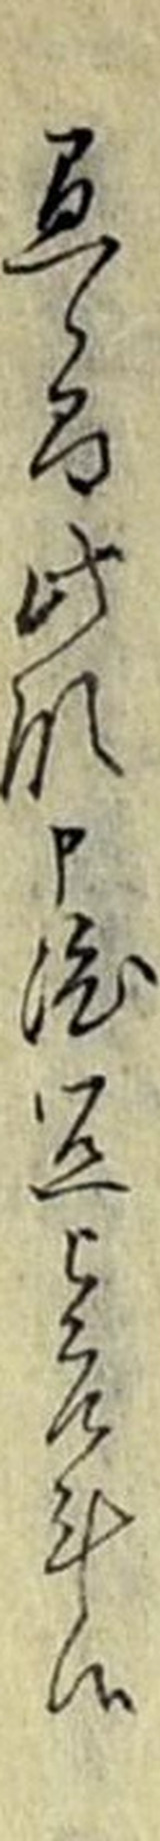置候間此段申渡宜被取斗候
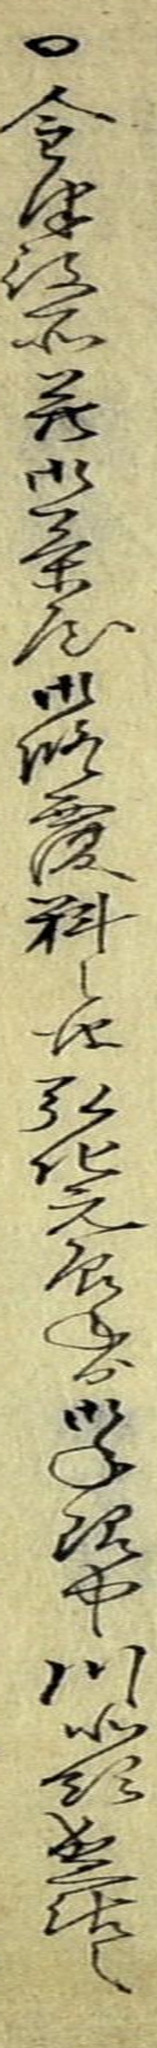○金津役所井御茶屋御修覆料之儀弘化元辰年ゟ御年限中川北領盛銀之
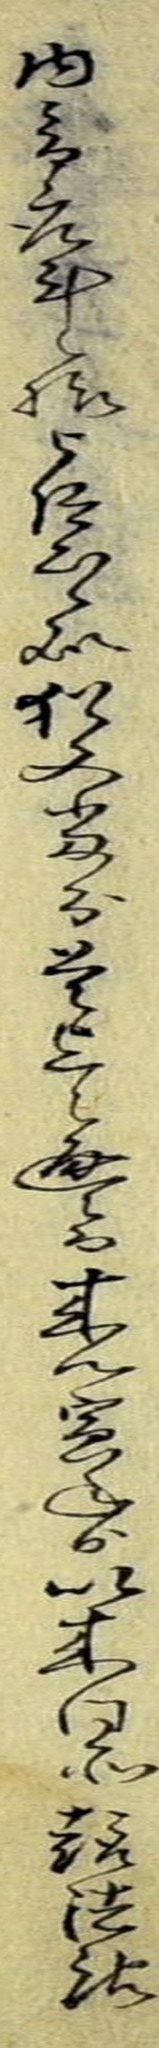内に而取斗候様被仰出候処猶又当分是迄之通に而来ル寅年ゟ以來同所趣法銀

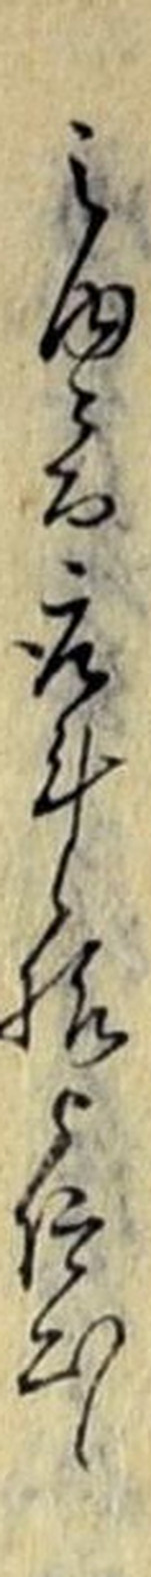之内に而取斗候様被仰出候
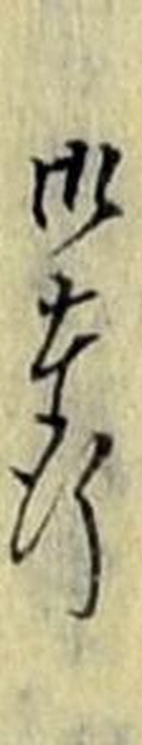御奉行
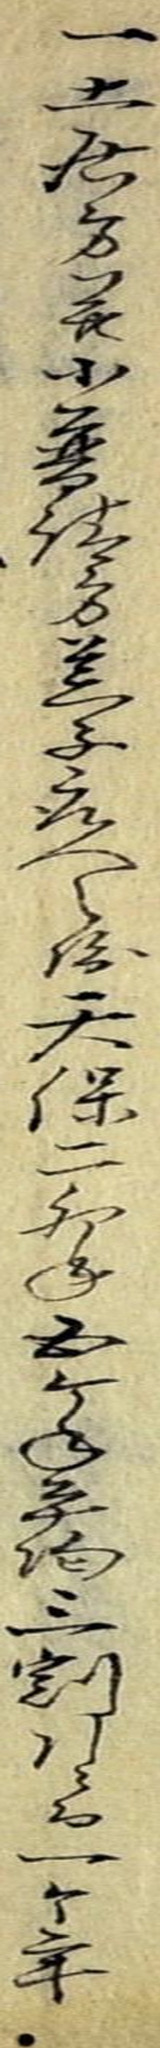○土居方井小普請方荒子取人之儀天保二卯年五ヶ年平金三割引に而一ケ年
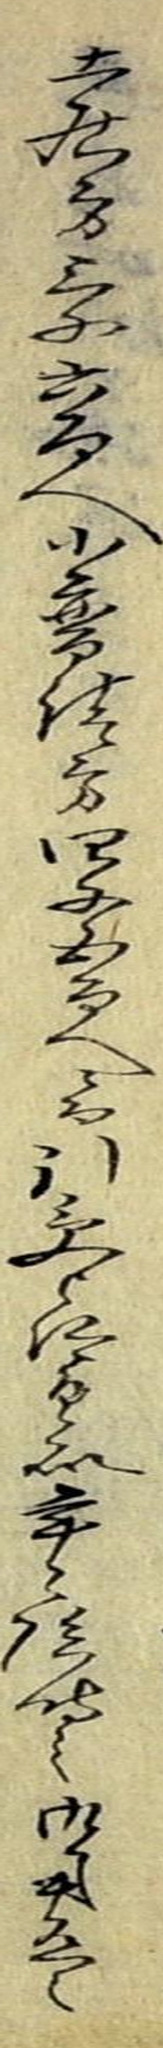土居方三千六百人小普請方四千五百人に而引受被仰付候処年々臨時之御用有之
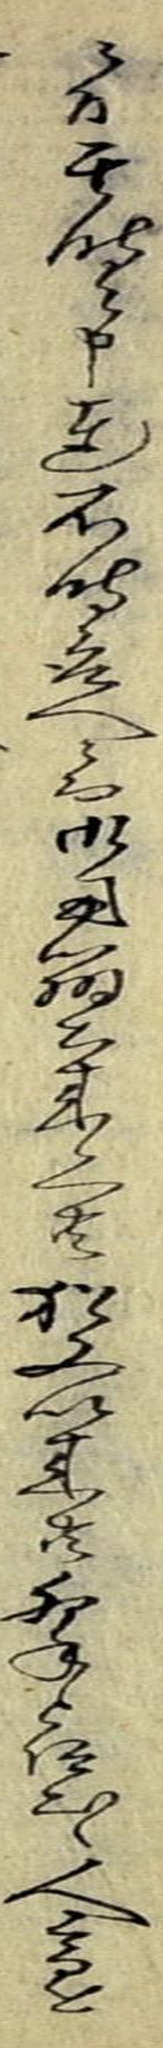に付其時々被申達不時取人に而御用弁出来候へ共猶又以來共卯年被仰出候人高を
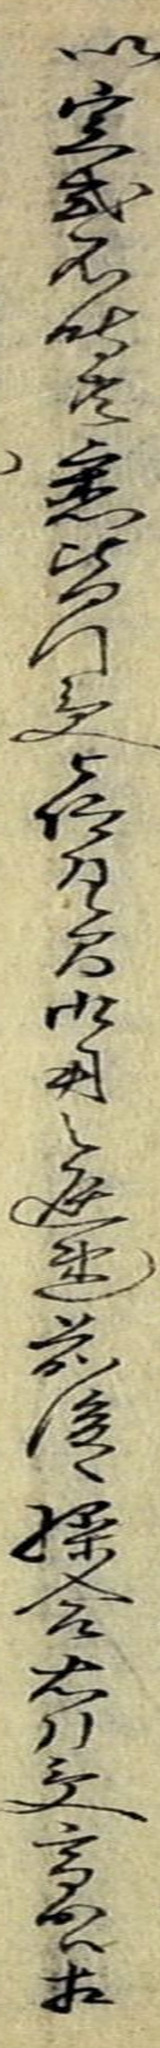以定式不時共悉皆引受被仰付候間御用之遅速前後へ繰合卯引受高ゟは相
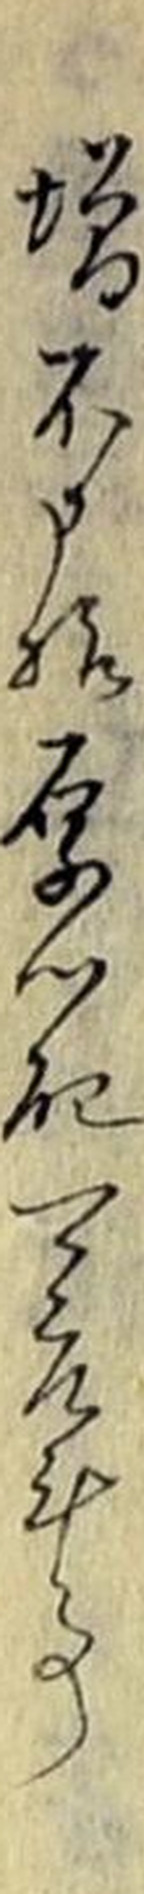増不申様厚心配可取斗事
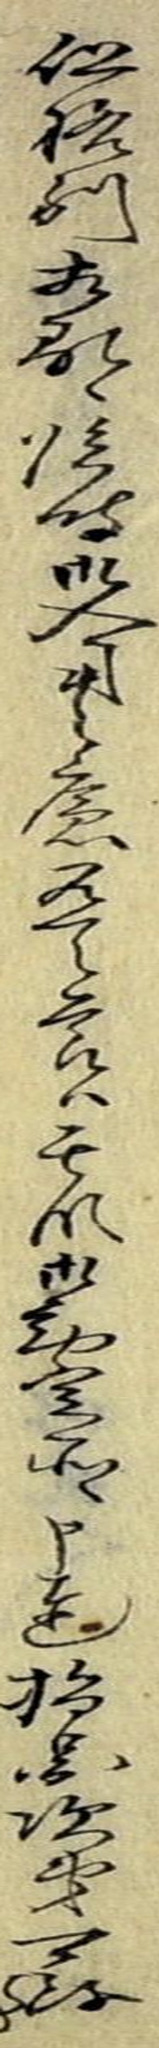但格別相願候臨時御入用之廉有之節は其段御勘定所へ申達指図次第可致事
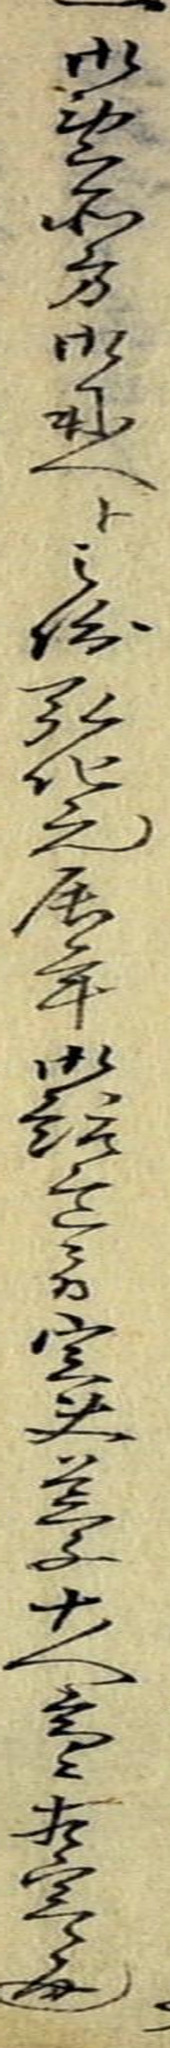一御台所方御用ト之儀弘化元辰年御趣意に付定夫荒子十人高に相定候通
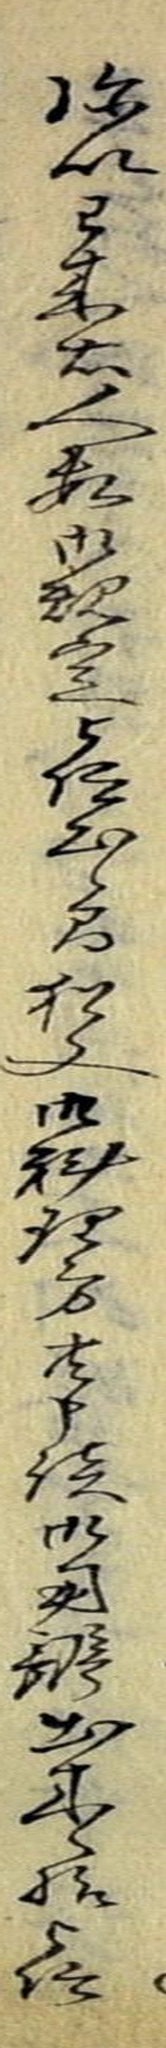弥以已来右人数御規定被仰出候間猶又御料理方共申談御用弁出来候様被仰
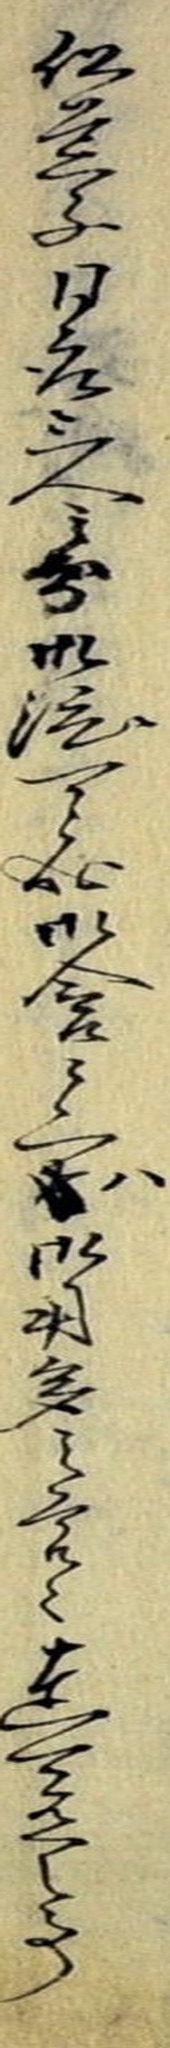但荒子日取三人之分御渡可成被御含に候へは御用多之節々達可有之事
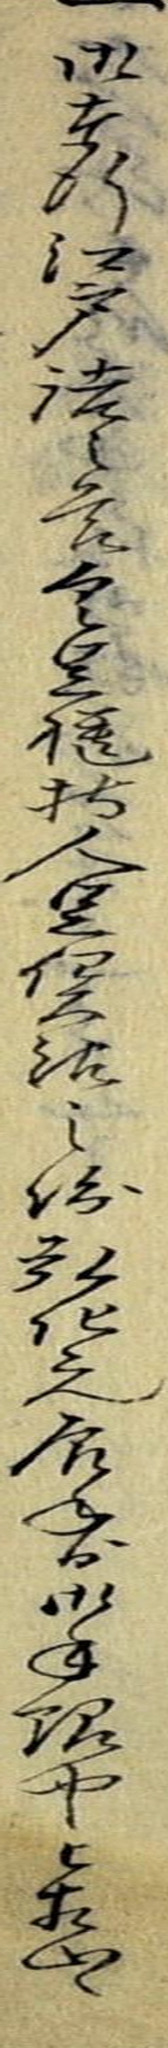一御奉行江戸詰之節具足櫃持人足賃銀之儀弘化元辰年ゟ御年限中被相止候
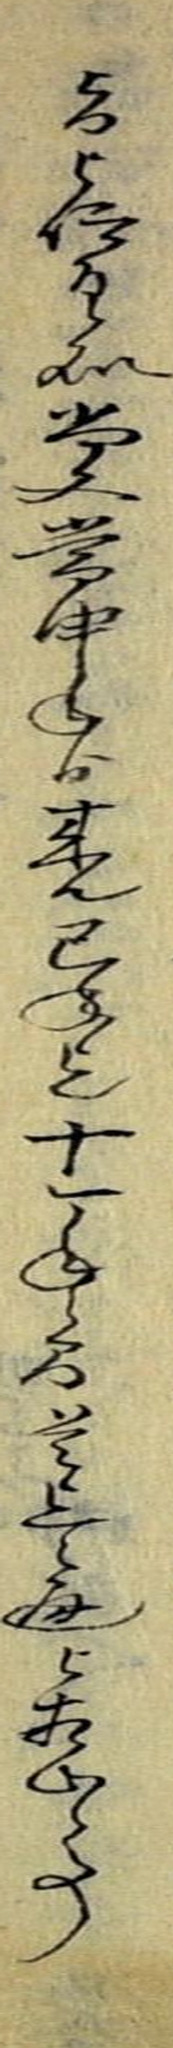旨被仰付候処尚又当申年ゟ来ル巳年迄十ヶ年之間是迄之通被相止候事
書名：命令之部 六
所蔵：福井県文書館 Fukui Prefectural Archives
